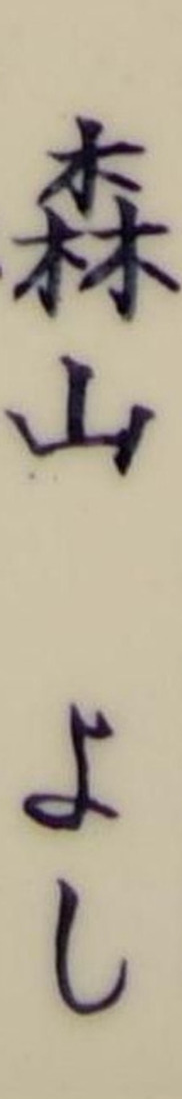森山よし
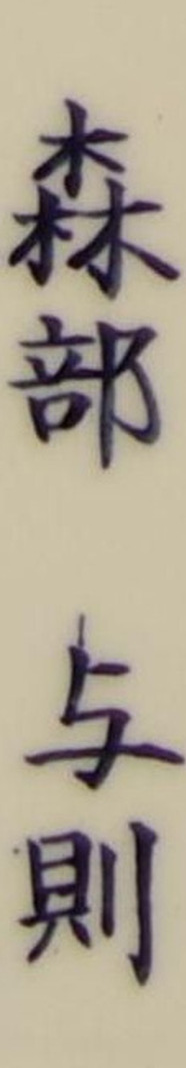森部与則
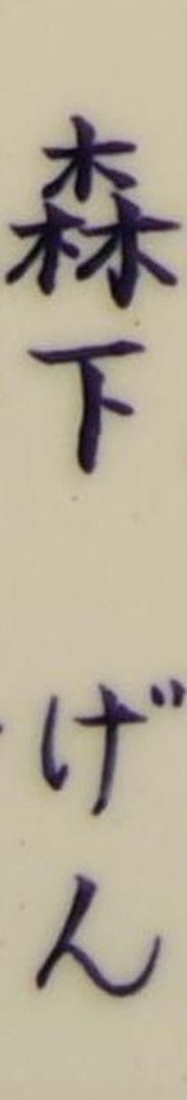森下げん
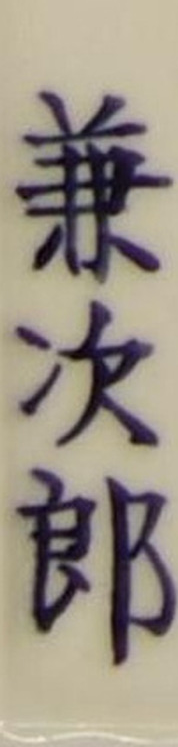兼次郎

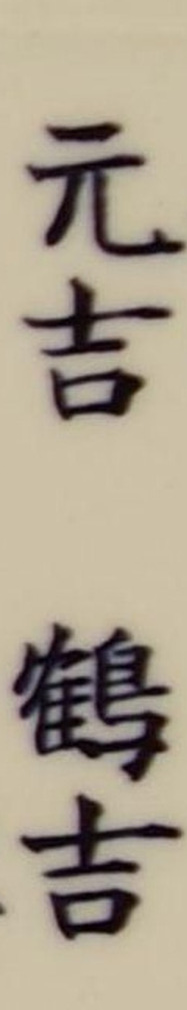元吉鶴吉
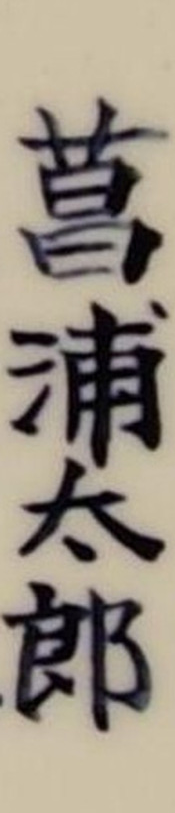菖蒲太郎
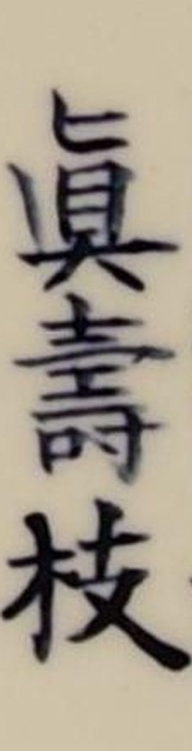真寿枝
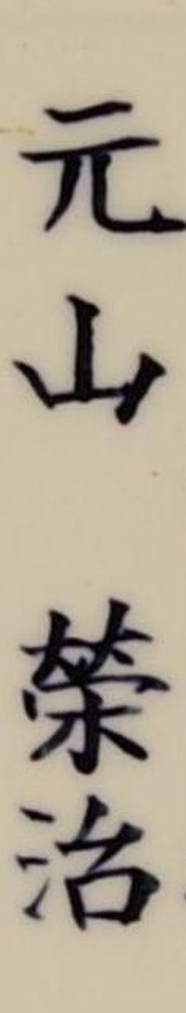元山栄治
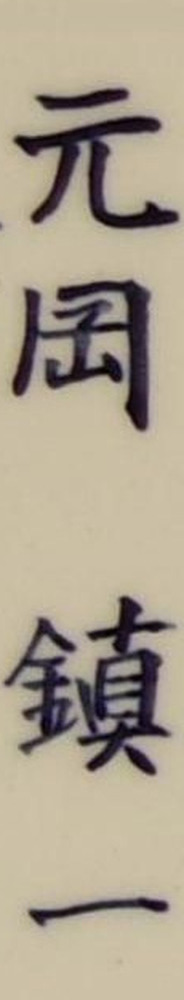元岡鎮一
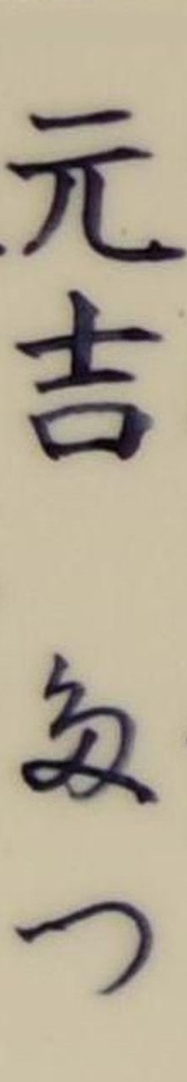元吉たつ
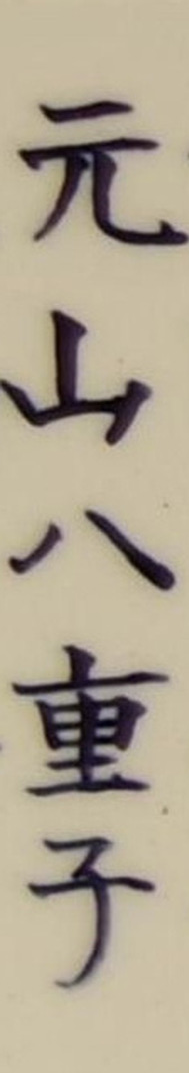元山八重子
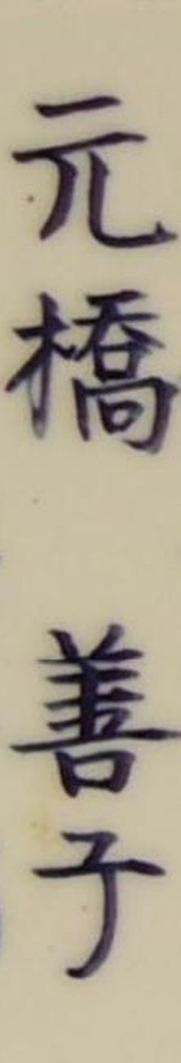元橋善子
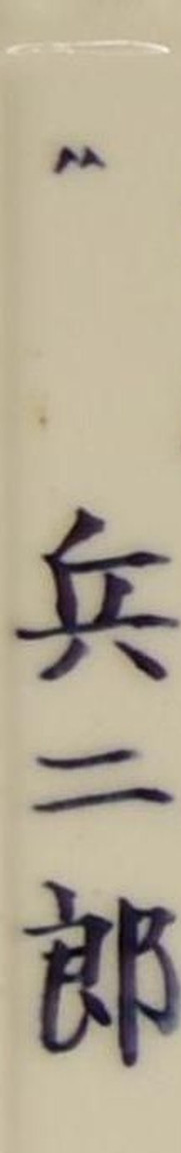兵二郎
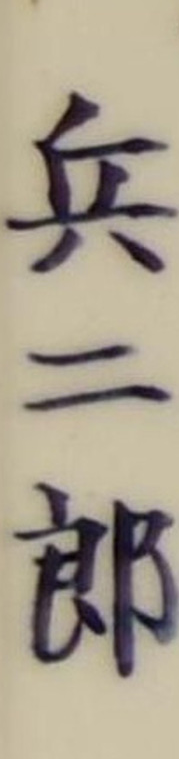兵二郎

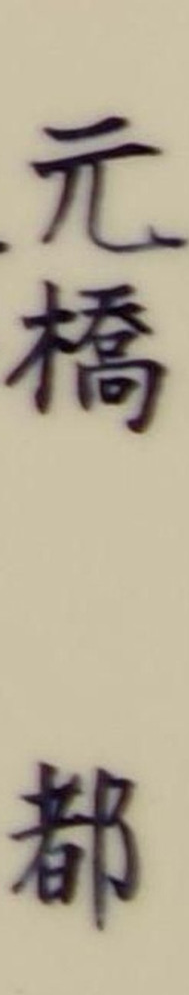元橋都
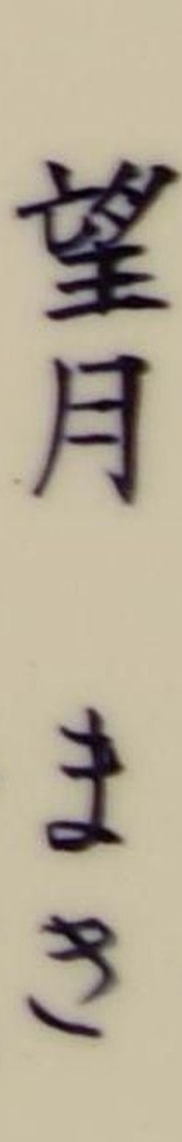望月まき
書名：A~D
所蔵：koyasan kongobuji
